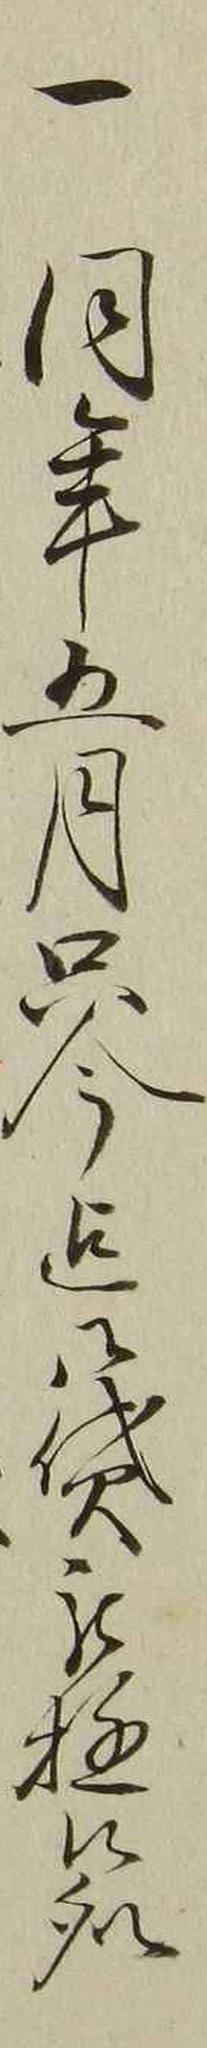一同年五月只今迄御貸被遊候処
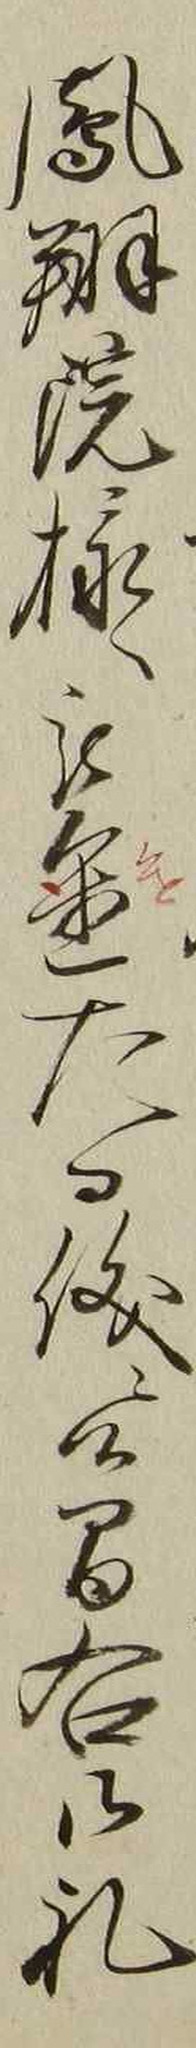鳳翔院様へ被金たる儀に候間右御礼
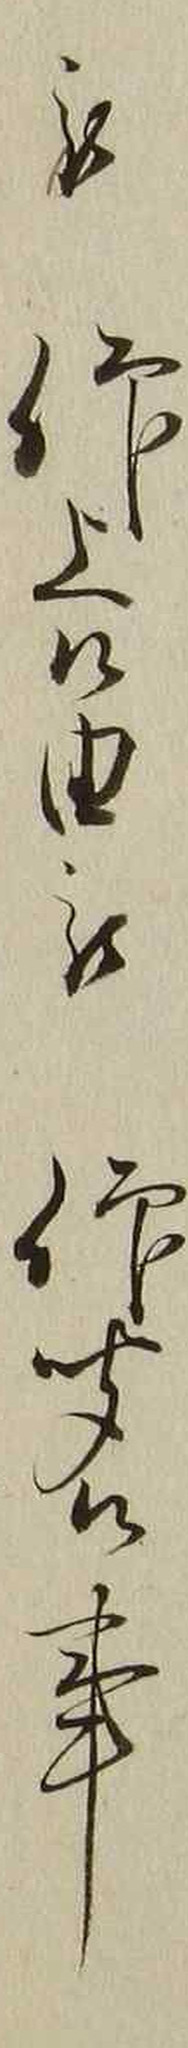被仰上候由被仰聞候事
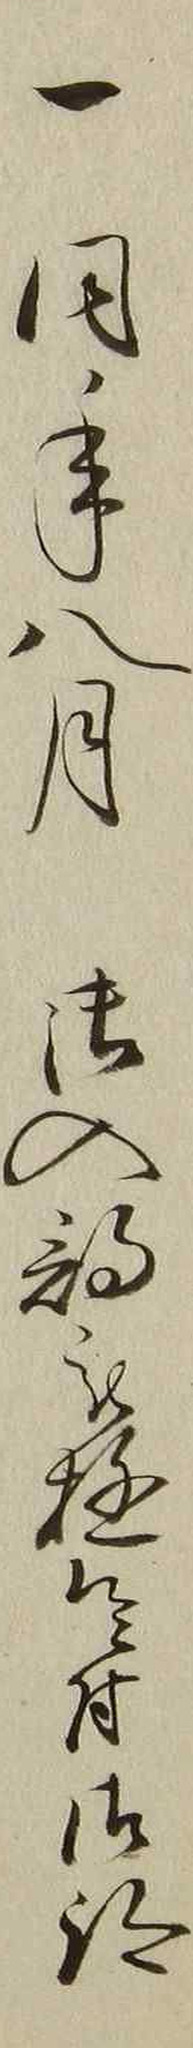一同年八月御入部被遊候に付御跡
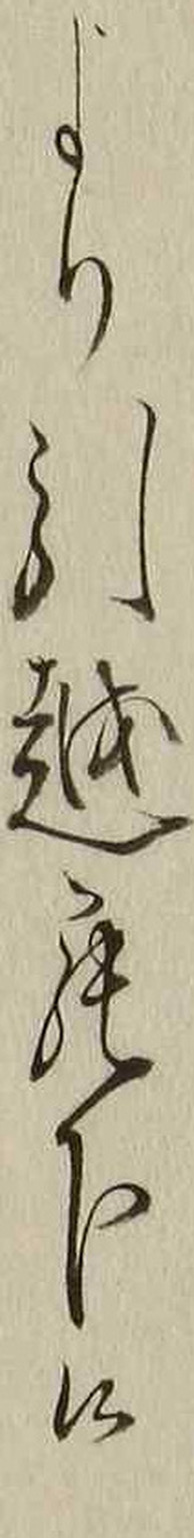より引越罷下候
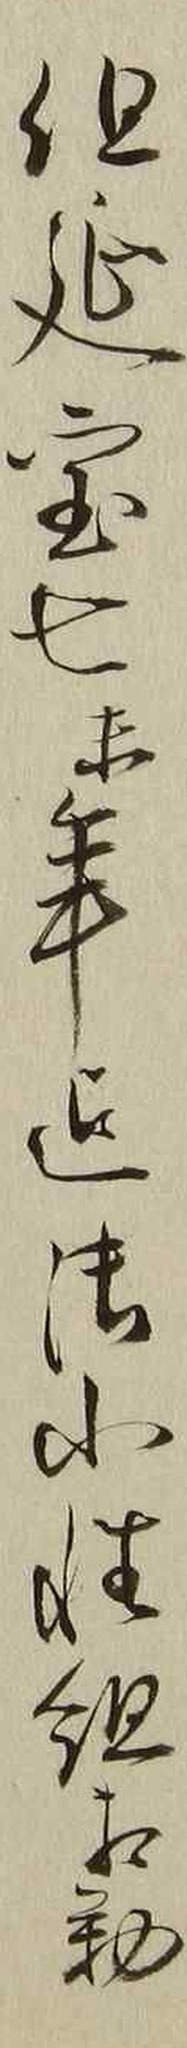但延宝七年未年迄御小性組相勤
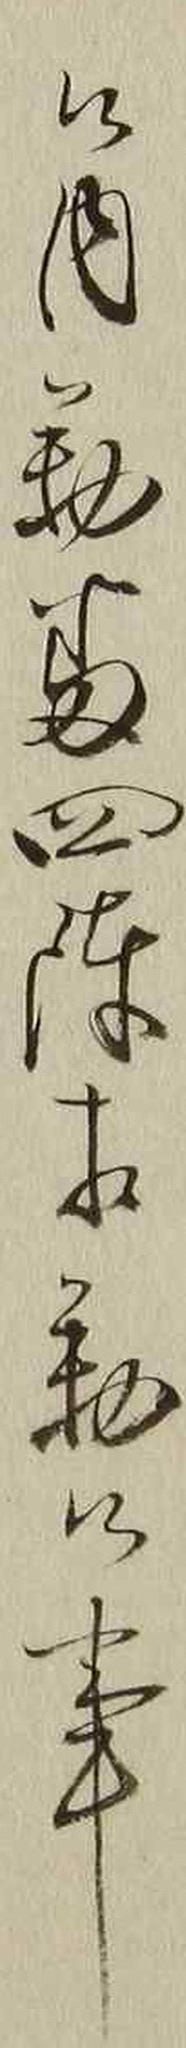候内勤番四陣相勤候事
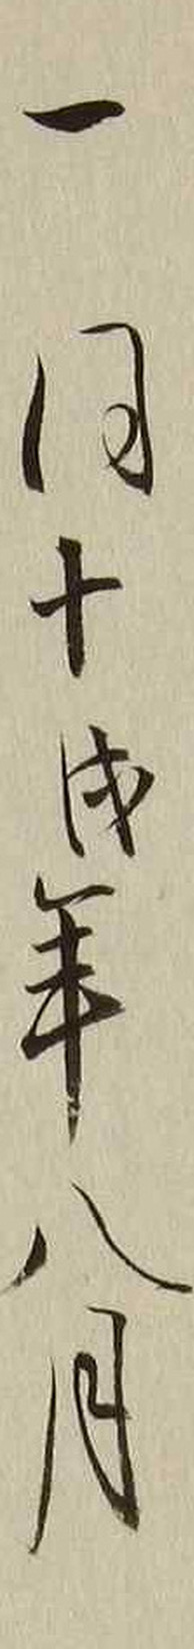一同十戌年八月
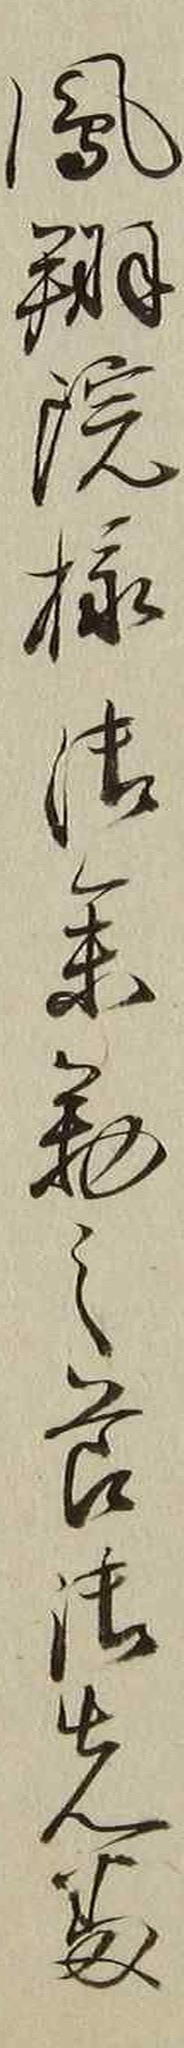鳳翔院様御参勤之節御先番
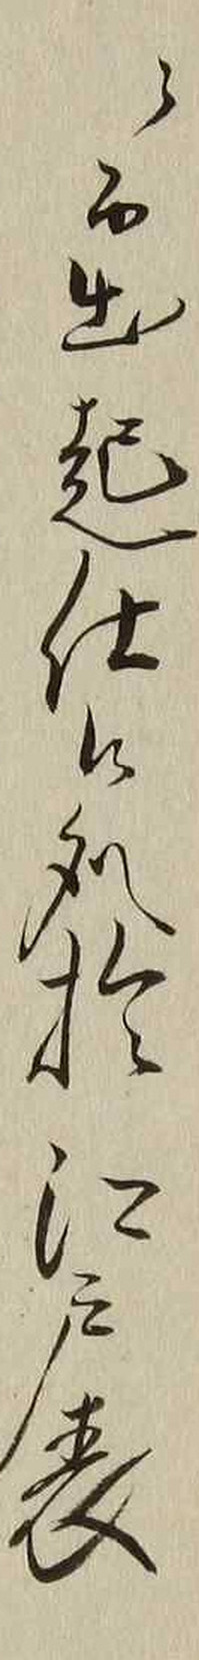に而出起仕候処於江戸表
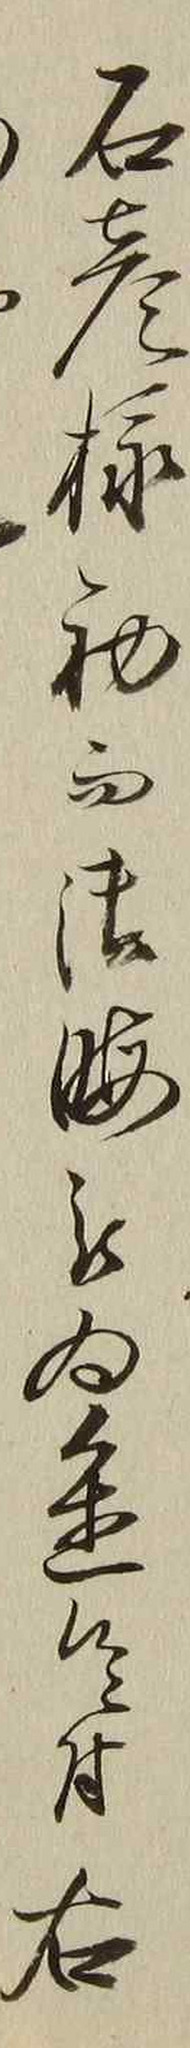石彦様初而御暇被為進候に付右
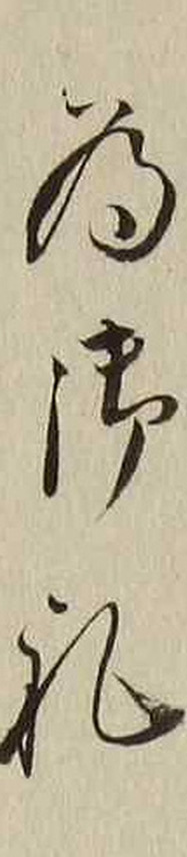為御礼
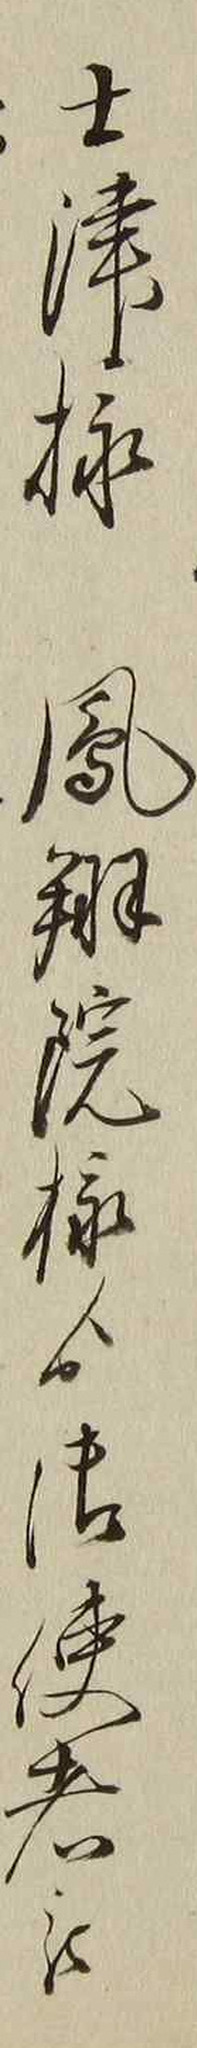士津様鳳翔院様ゟ御使者被
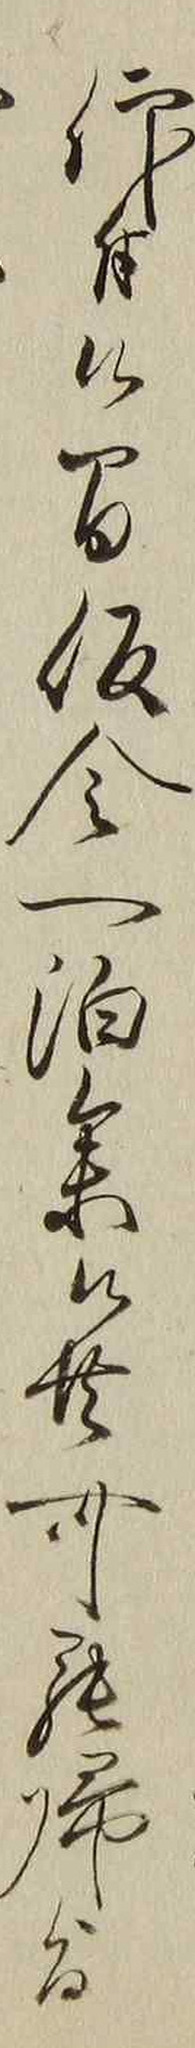仰付候間仮令一泊参候共可罷帰旨
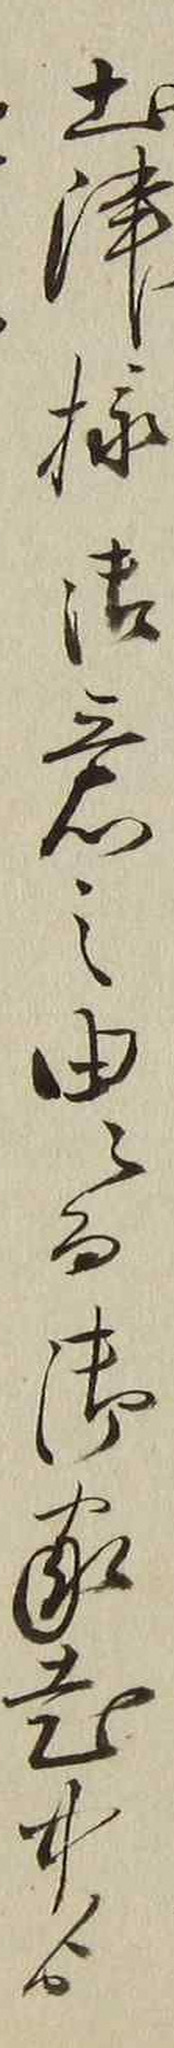土津様御意之由に而御家老中ゟ
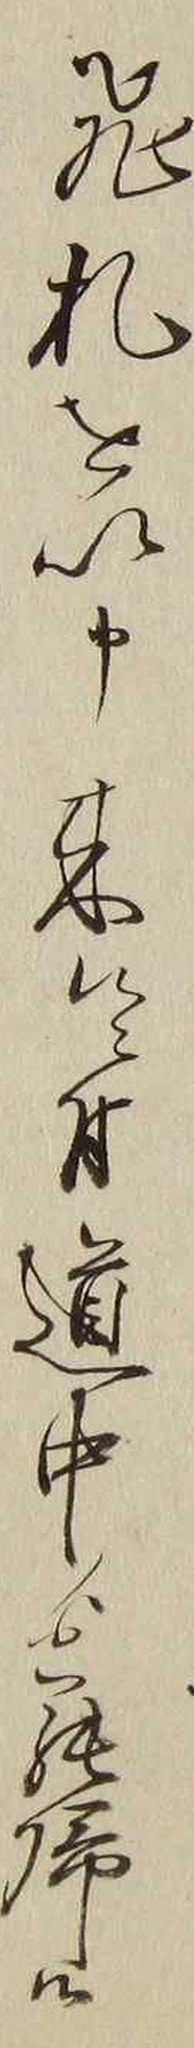飛札を以申来候に付道中ゟ罷帰候
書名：諸士系譜　巻之103　か之部11
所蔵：会津若松市立会津図書館
